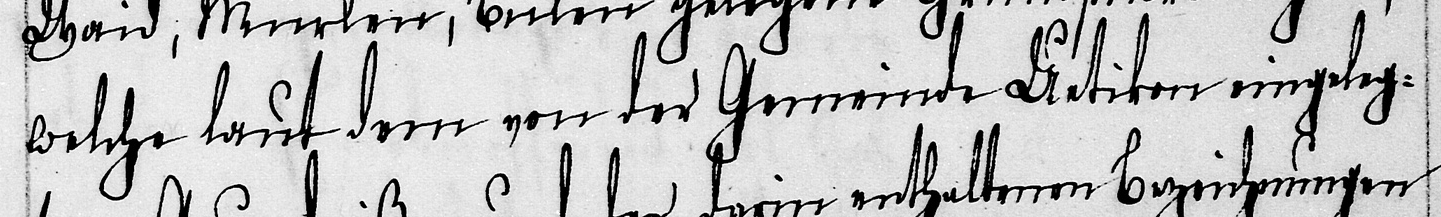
welche laut dem von der Gemeinde Uetikon eingeleg¬
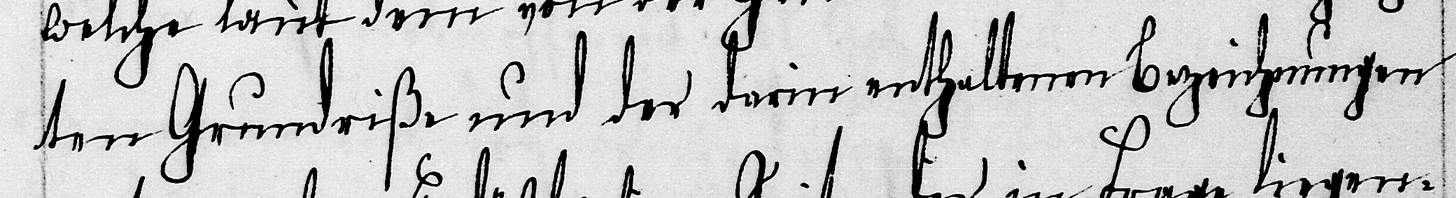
ten Grundriße und der darin enthaltenen Bezeichnungen
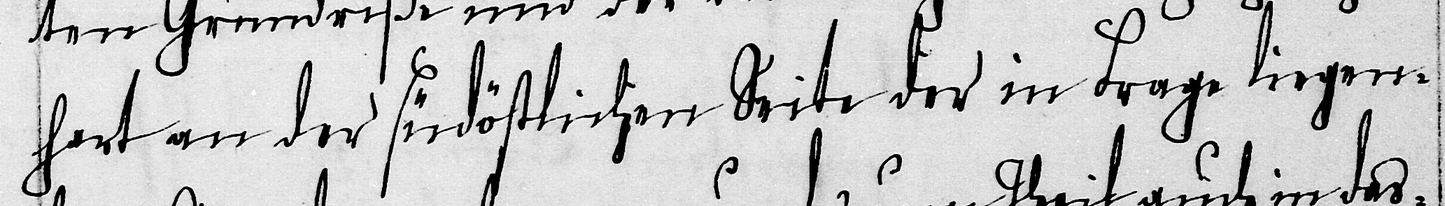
hart an der südöstlichen Seite der in Frage liegen¬
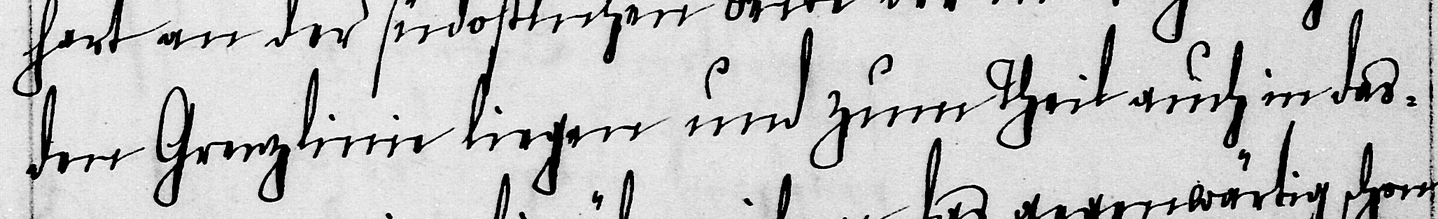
den Grenzlinie liegen und zum Theil auch in das¬
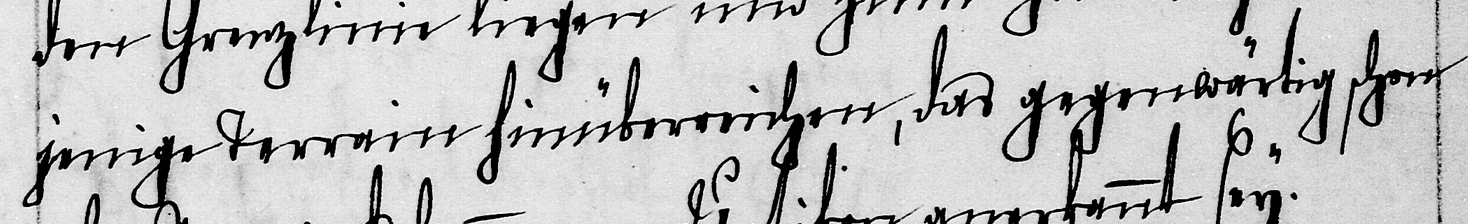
jenige Terrain hinüberreichen, das gegenwärtig schon
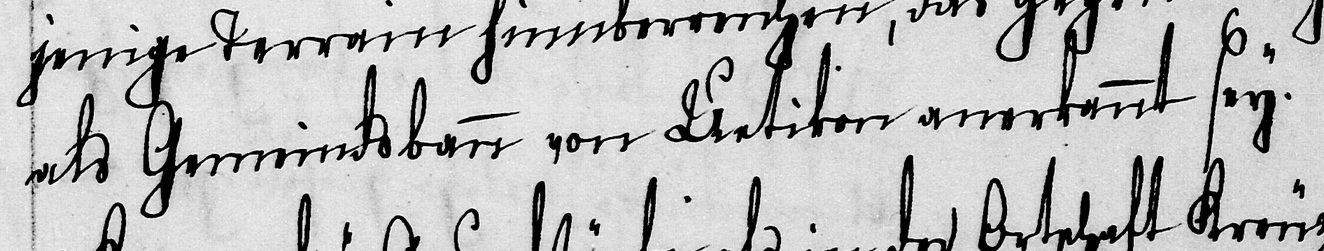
als Gemeindsbann von Uetikon anerkannt sey.
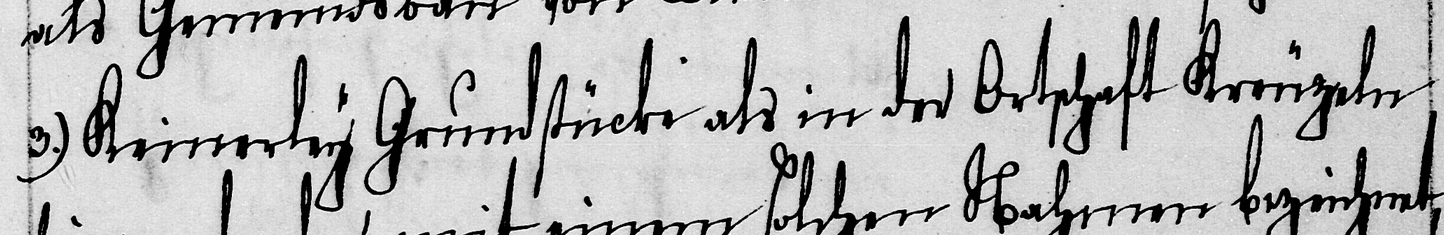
3.) Keinerley Grundstücke als in der Ortschaft Kreuzeln
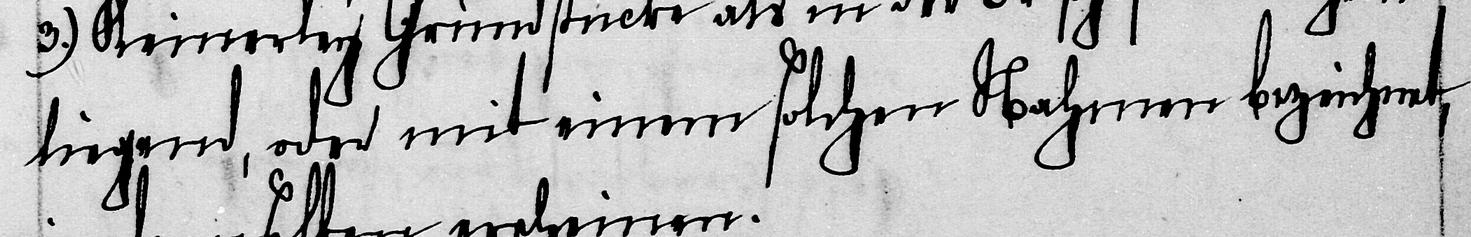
liegend, oder mit einem solchen Nahmen bezeichnet,
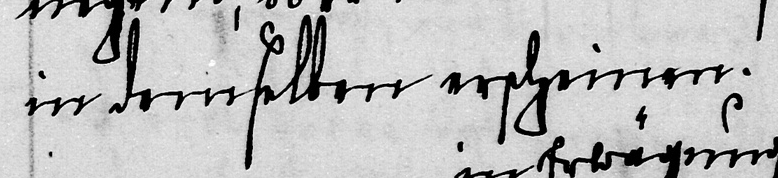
in demselben erscheinen.
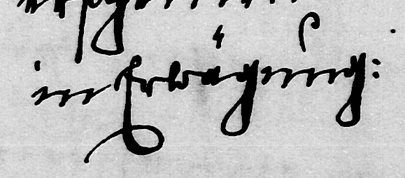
in Erwägung:
